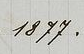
1877.
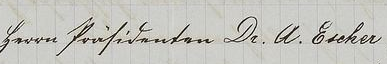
Herrn Präsidenten Dr. A. Escher,
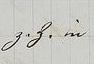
z. Z. in
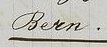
Bern.
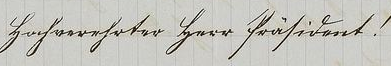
Hochverehrter Herr Präsident!
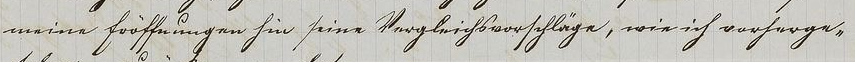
meine Eröffnungen hin seine Vergleichsvorschläge, wie ich vorherge-
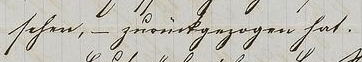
sehen, – zurückgezogen hat.
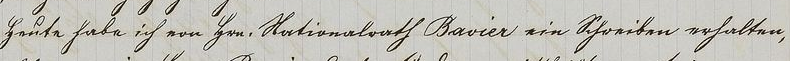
Heute habe ich von Hrn. Nationalrath Bavier ein Schreiben erhalten,
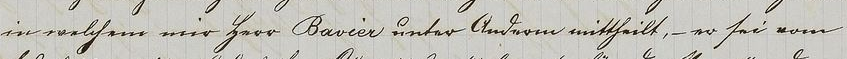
in welchem mir Herr Bavier unter Anderm mittheilt, – er sei vom
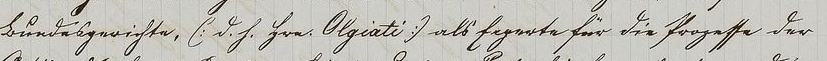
Bundesgerichte, (d. h. Hrn. Olgiati ) als Experte für die Prozesse der
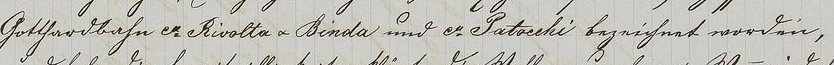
Gotthardbahn caRivolta & Binda und caPatocchi bezeichnet worden,
